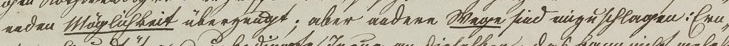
enden Möglichkeit überzeugt; aber andere Wege sind einzuschlagen: Ern-
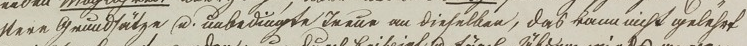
stere Grundsätze &. unbedingte Treue an dieselben, das kann nicht gelehrt
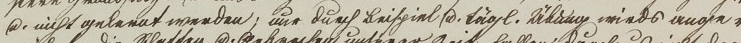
&. nicht gelernt werden; nur durch Beispiel &. tägl. Übung wirds ange-
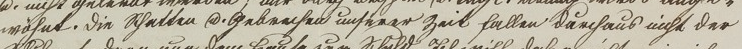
wöhnt. Die Schatten &. Gebrechen unserer Zeit fallen durchaus nicht der
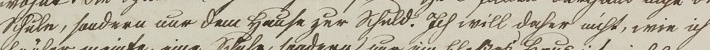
Schule, sondern nur dem Hause zur Schuld. Ich will daher nicht, wie ich
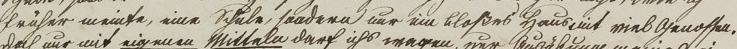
früher meinte, eine Schule, sondern nur ein bloßes Haus mit viel Genossen.
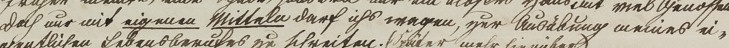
Doch nur mit eigenen Mitteln darf ichs wagen, zur Ausübung meines ei-
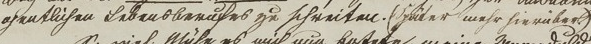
gentlichen Lebensberufes zu schreiten. (Später mehr hierüber.)
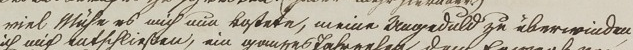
viel Mühe es mich nun kostete, meine Ungeduld zu überwinden,
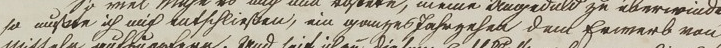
so mußte ich mich entschlißen, ein ganzes Jahrzehen dem Erwerb von
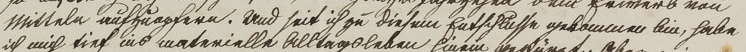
Mitteln aufzuopfern. Und seit ich zu diesem Entschlusse gekommen bin, habe
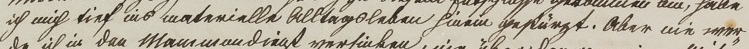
ich mich tief ins materielle Alltagsleben hinein gestürzt. Aber nie wer-
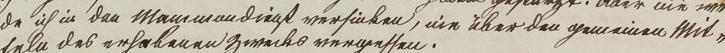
de ich in den Mammondienst versinken, nie über den gemeinen Mit-
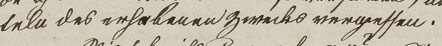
teln des erhabenen Zwecks vergessen.
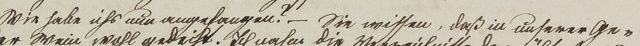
Wie habe ichs nun angefangen? – Sie wissen, daß in unserer Ge-
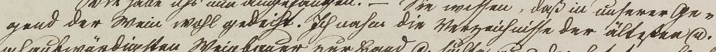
gend der Wein wohl gedeiht. Ich nahm die Verzeichnisse der ältesten &.
